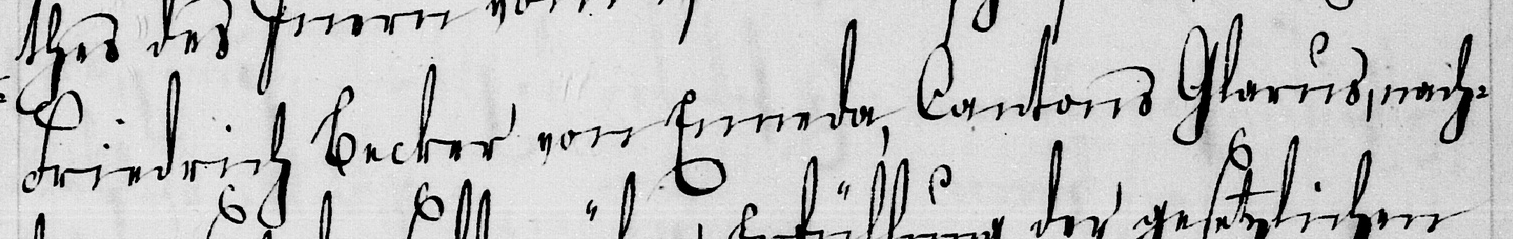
Friedrich Becker von Enneda, Cantons Glarus, nach¬
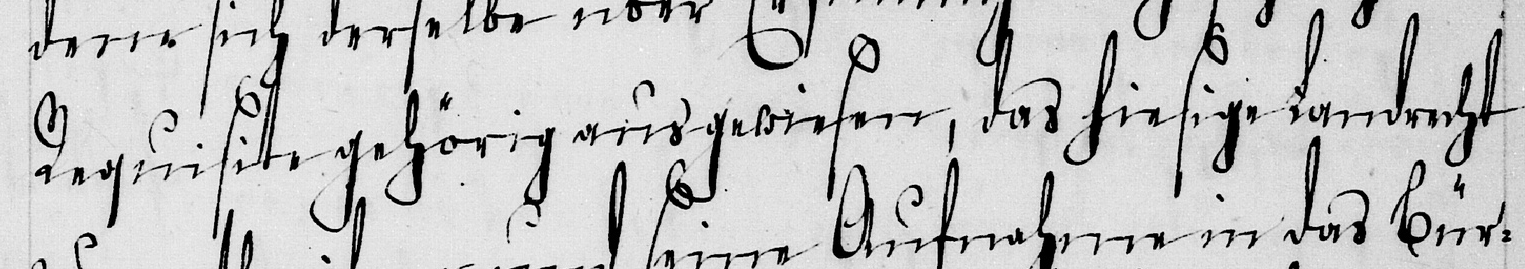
Requisite gehörig ausgewiesen, das hiesige Landrecht
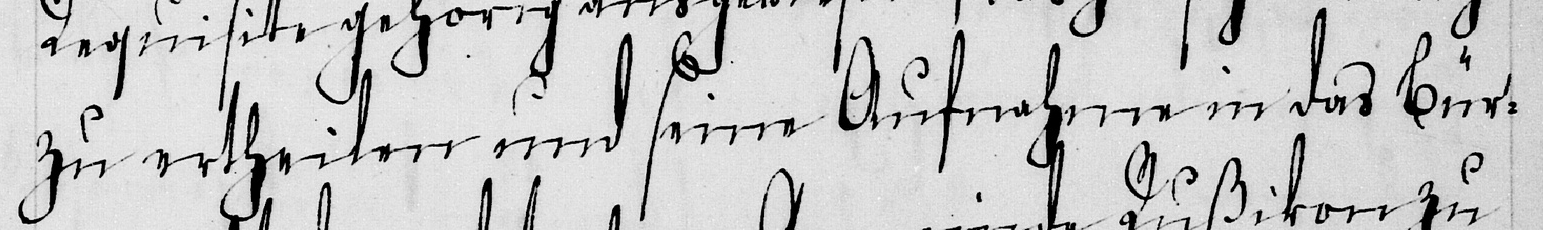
zu ertheilen und seine Aufnahme in das Bür¬
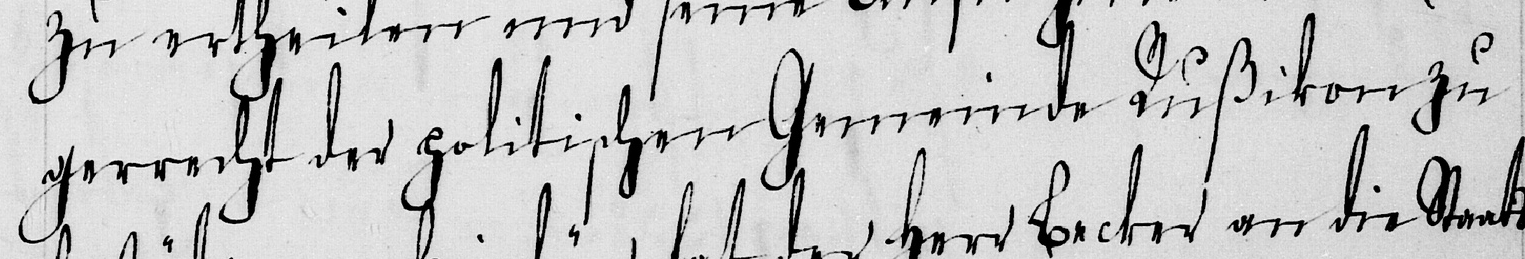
gerrecht der politischen Gemeinde Rußikon zu
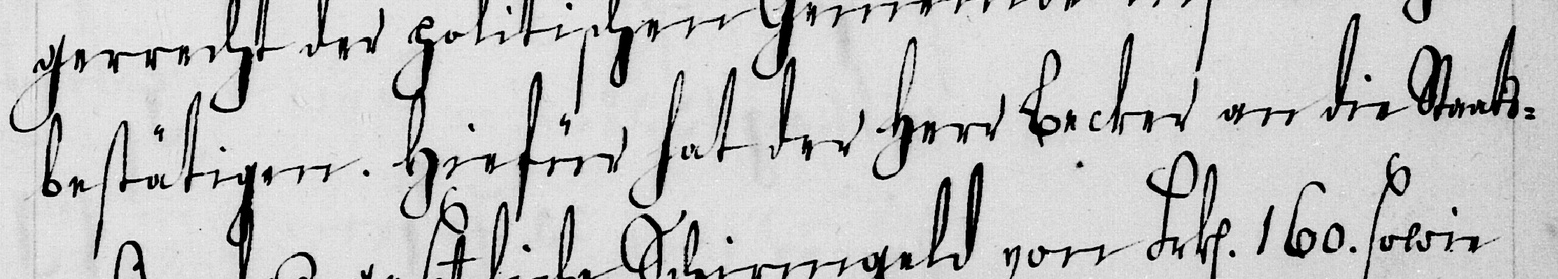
bestätigen. Hiefür hat der Herr Becker an die Staat¬
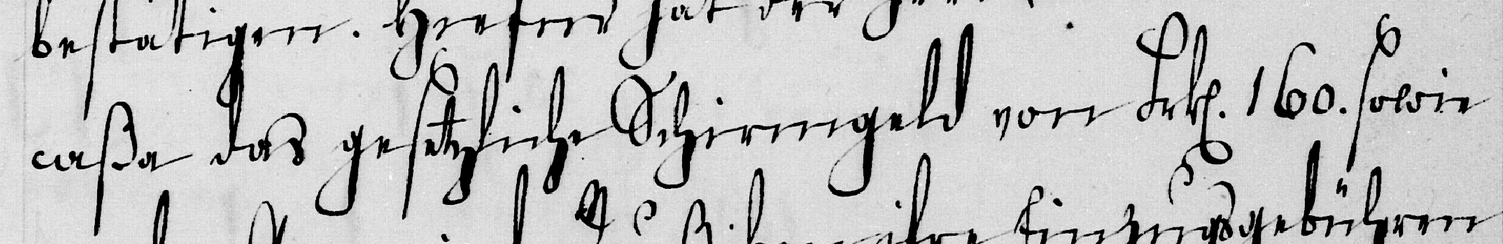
scaßa das gesetzliche Schirmgeld von Frk[en]. 160. sowie
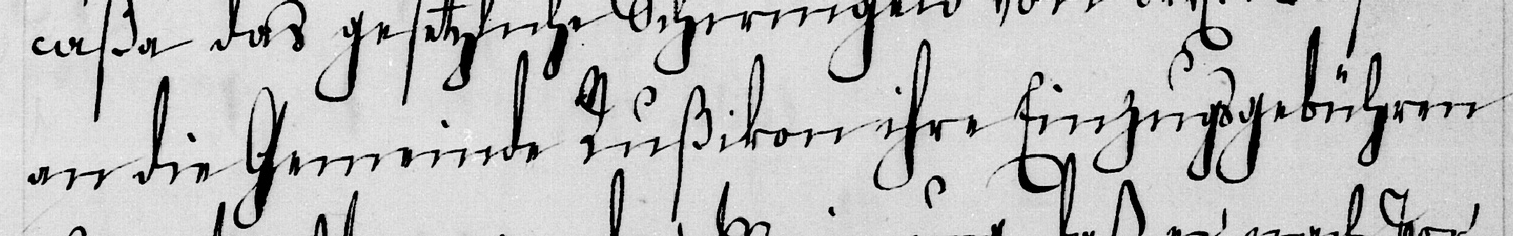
an die Gemeinde Rußikon ihre Einzugsgebühren
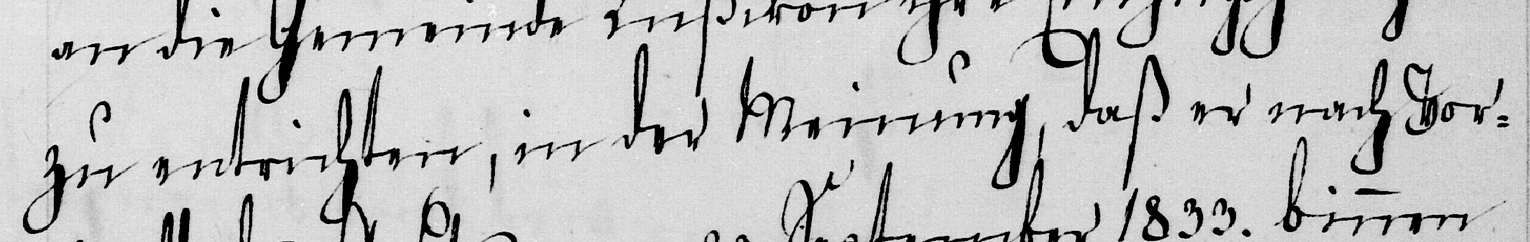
zu entrichten, in der Meinung, daß er nach Vor¬
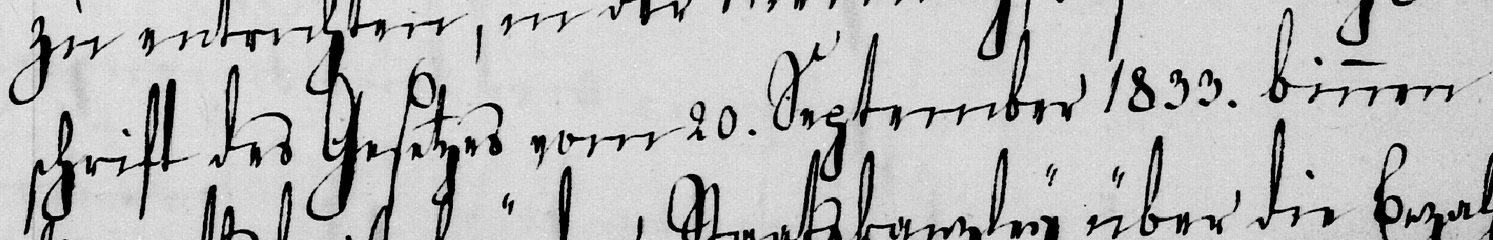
schrift des Gesetzes vom 20. September 1833. binnen
